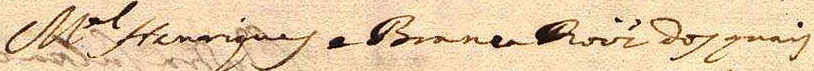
Mel Henriques e Branca Roiz̄ dos quais
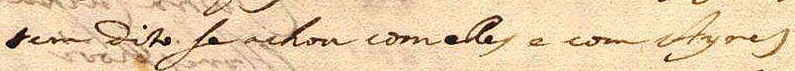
tem dito se achou com elles e com Ayres
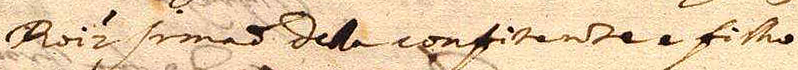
Roiz̄ jrmaõ della confitente e filho
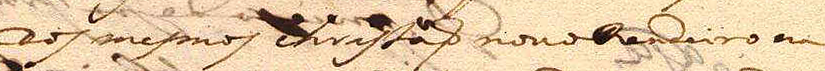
dos mesmos christaõ nouo Rendeiro na
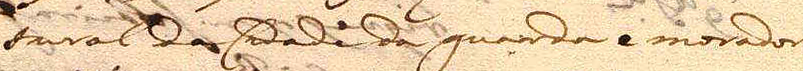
tural da Cidade da guarda e morador
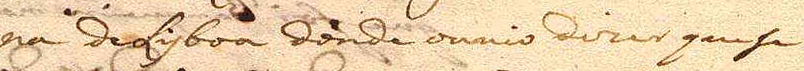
na de Lisboa donde ouuio dizer que se
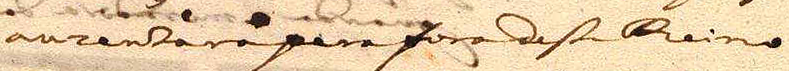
auzentara pera fora deste Reino
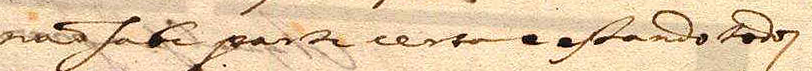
naõ sabe parte certa e estando todos
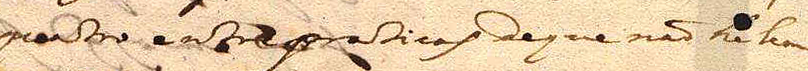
quatro entre praticas de que naõ he lem
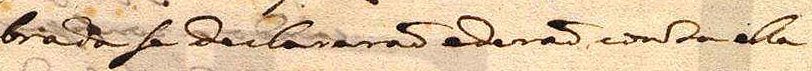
brada se declararaõ e deraõ conta ella
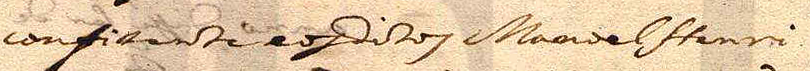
confitente e os ditos Manoel Henri
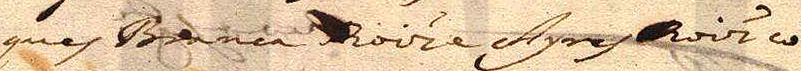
ques Branca Roiz̄ e Ayres Roiz̄ co
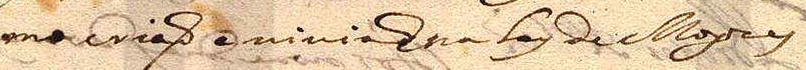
mo criaõ e uiuiaõ na ley de Moyzes
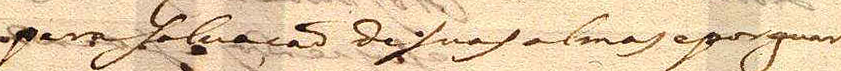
para saluaçaõ de suas almas e por guar
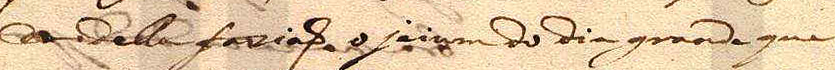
da della faziaõ o jeium do dia grande que
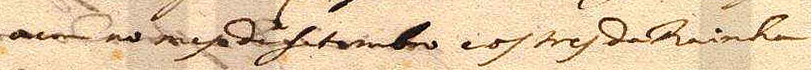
uem no mes de setembro e os tres da Rainha
